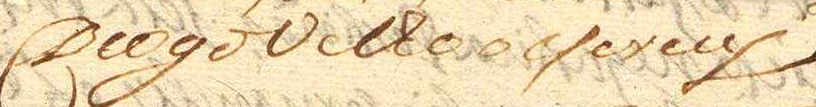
Diogo Velho o escreuj
